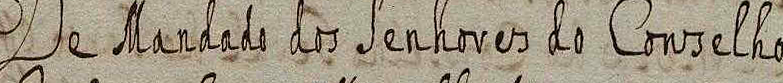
De Mandado dos Senhores do Conselho
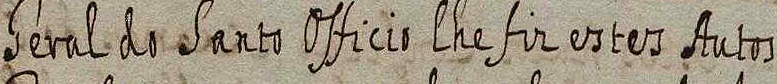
Geral do Santo Officio lhe fiz estes Autos
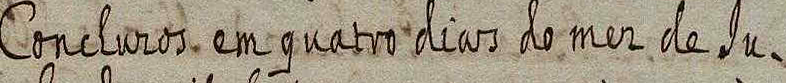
Concluzos em quatro dias do mez de Iu
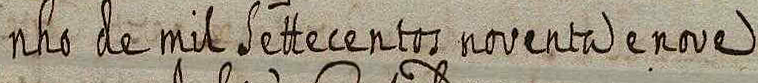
nho de mil Settecentos noventa e nove
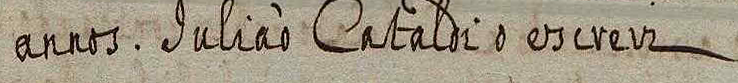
annos. Iulião Cataldi o escrevi
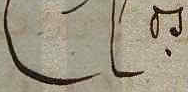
CL.os
